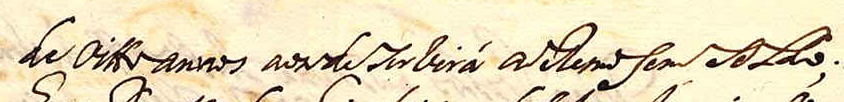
de oitto annos aonde servirá a Remo sem soldo;
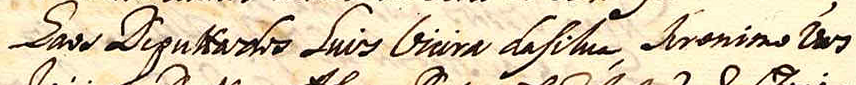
E aos Deputtados Luis Vieira da Silua, Jeronimo vas
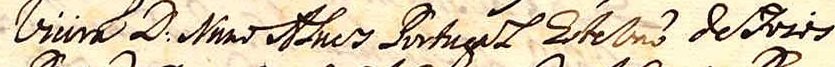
Vieira D: Nuno Alues Portugal Estevaõ de Foios
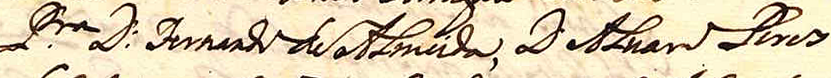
P.ra D: Fernando de Almeida, D Aluaro Peres
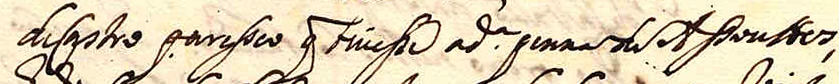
de Castro paresseo q̄ tiuesse a d.a penna de Assouttes
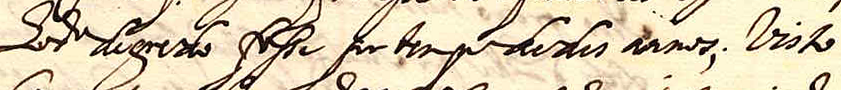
E o do degredo fosse por tempo de des annos; visto
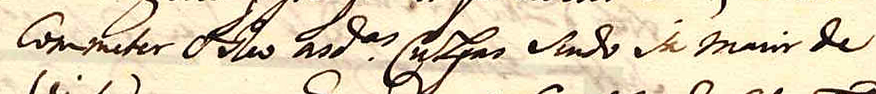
Commeter o Reo as d.as Culpas sendo ja maior de
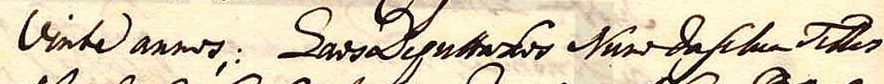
Vinte annos: E aos Deputtados Nuno da silua Telles
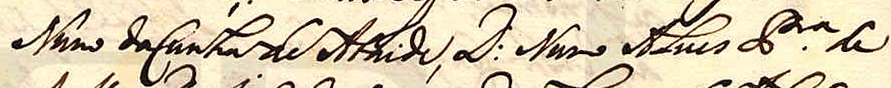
Nuno da Cunha de Ataide, D: Nuno Alues P.ra de
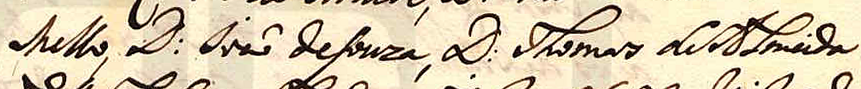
Mello, D. Ioaõ de souza, D: Thomas de Almeida
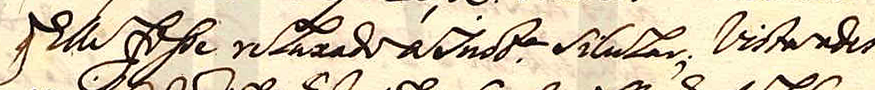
q̄ Elle fosse relaxado a Iust.a siCular; Vista a des
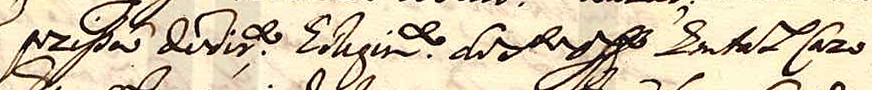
pozissaõ de dir.to E Regim.to do s.to offo Em taL Cazo
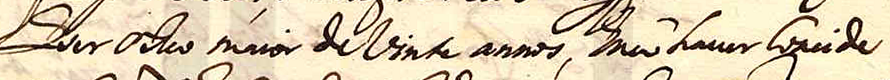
E ser o Reo maior de Vinte annos, E naõ hauer Concide
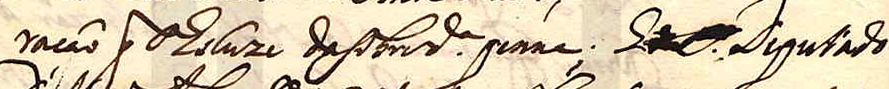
raçaõ q̄ o EsCuze da sobred.a penna; E o Deputado
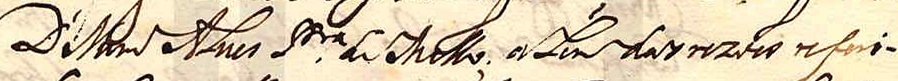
D Nuno Alues P.ra de Mello; alem das rezoes referi
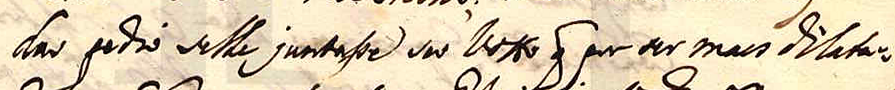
das pedio se lhe juntasse seo votto q̄ por ter maes dilata
